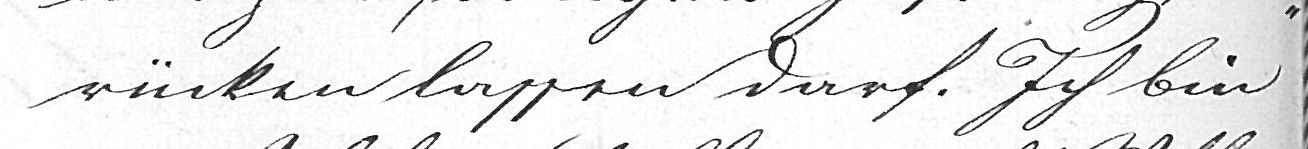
rücken lassen darf. Ich bin
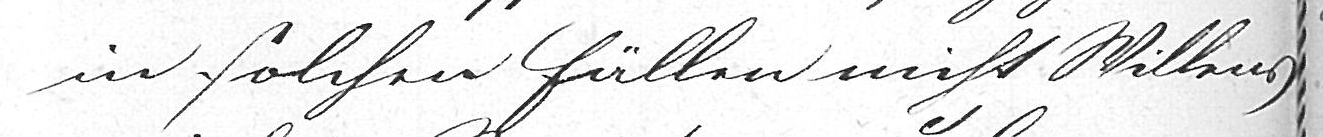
in solchen Fällen nicht Willens,
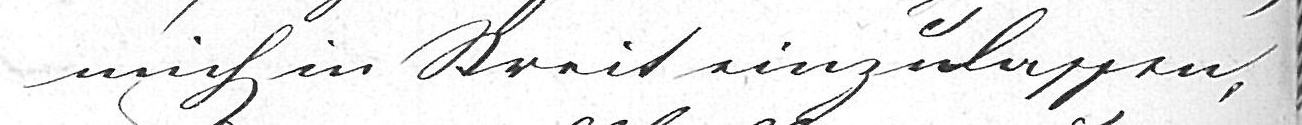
mich in Streit einzulassen,
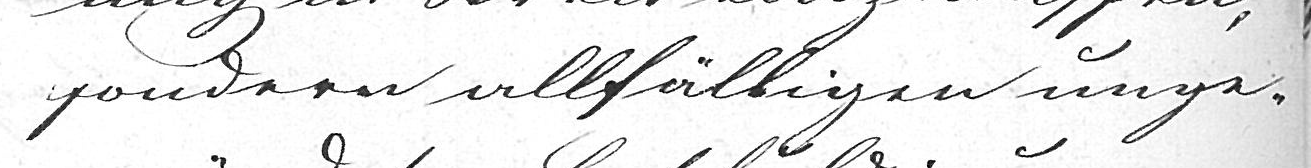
sondern allfälligen unge-
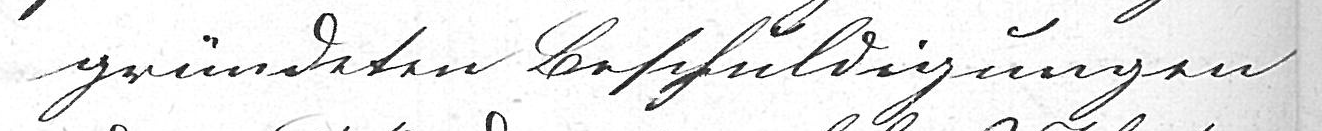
gründeten Beschuldigungen
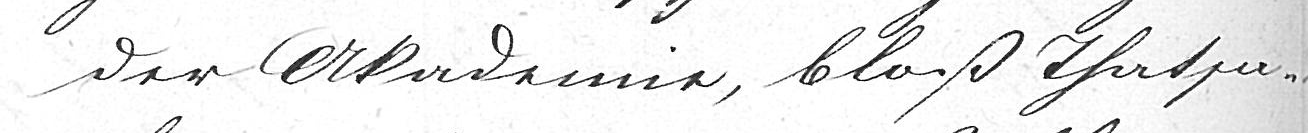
der Akademie, bloß Thatsa-
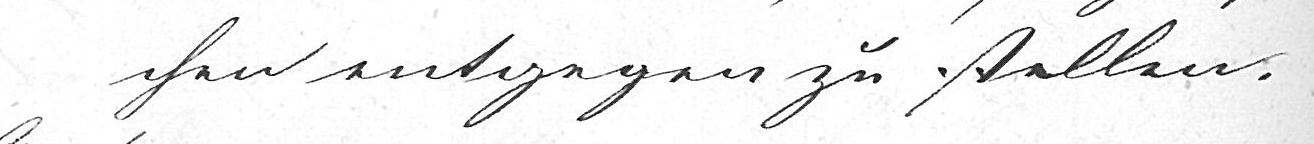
chen entgegen zu stellen.
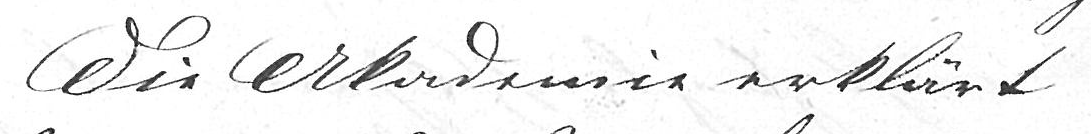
Der Akademie erklärt
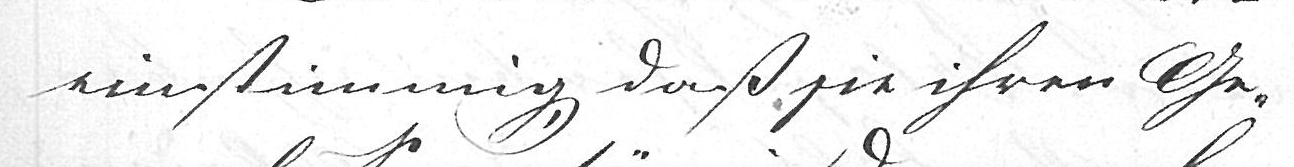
einstimmig, daß sie ihren Ge-
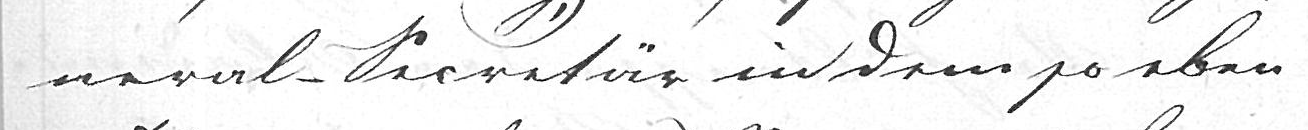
neral-Secretär in dem so eben
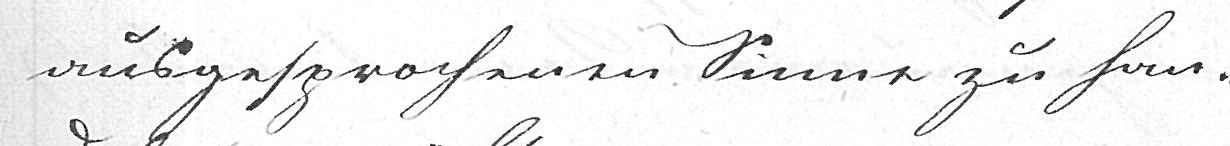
ausgesprochenen Sinne zu han-
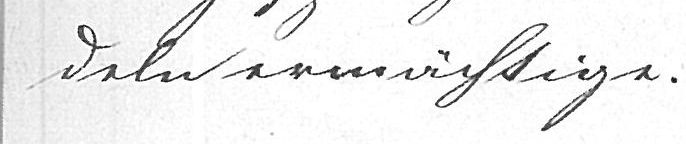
deln ermächtige.
